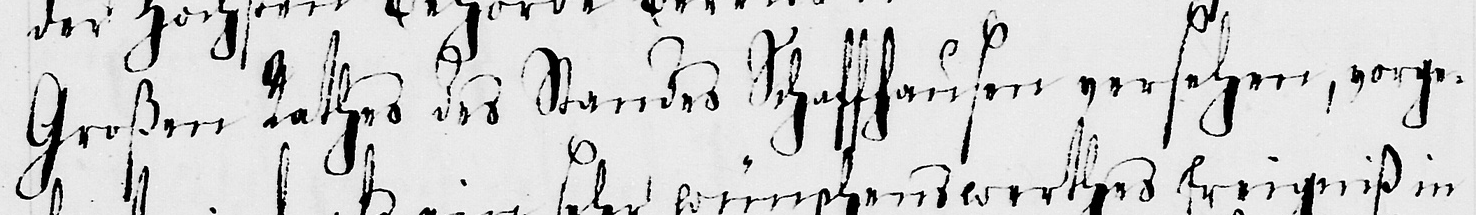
Großen Rathes des Standes Schaffhausen versehen, vorge¬
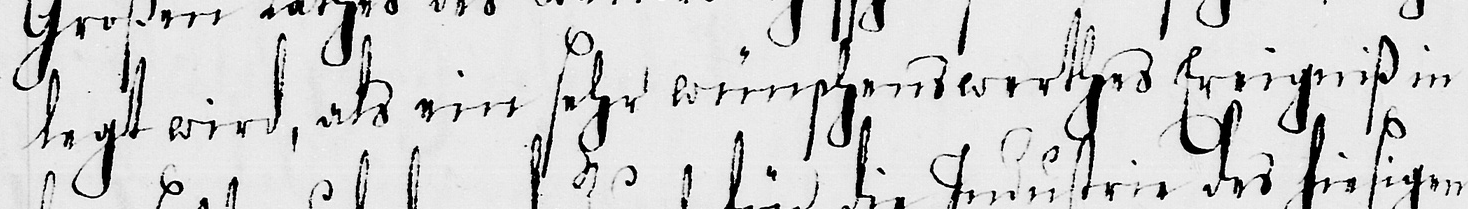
legt wird, als ein sehr wünschenswerthes Ereigniß in
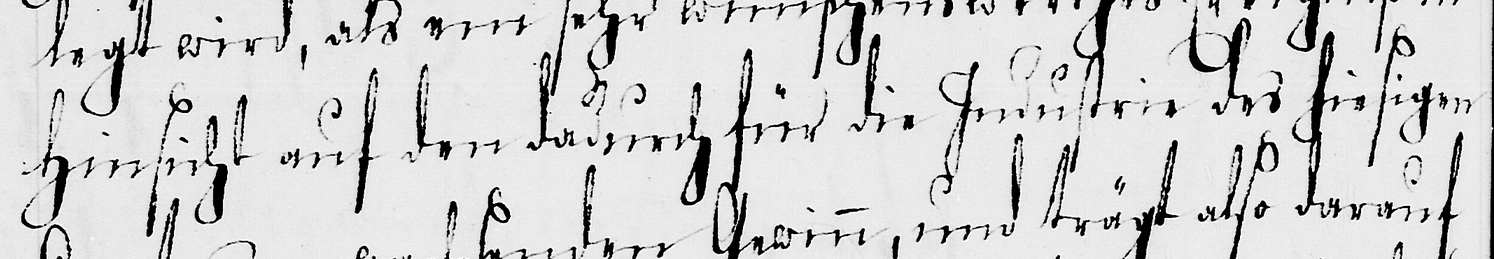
Hinsicht auf den dadurch für die Industrie des hiesigen
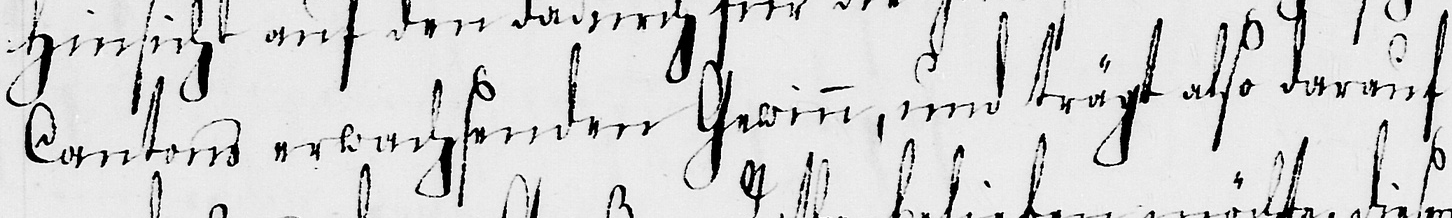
Cantons erwachsenden Gewinn, und trägt also darauf
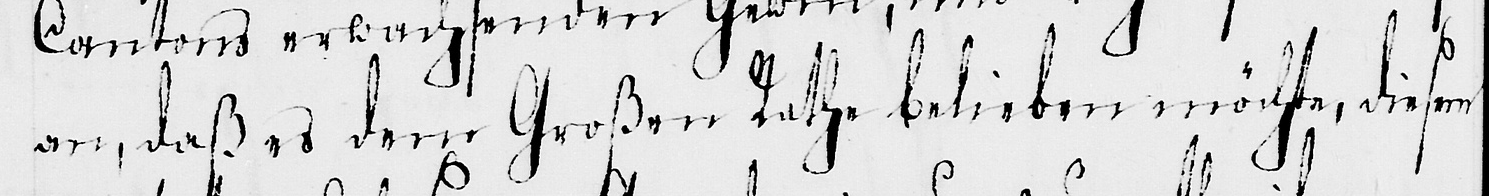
an, daß es dem Großen Rathe belieben möchte, diesem
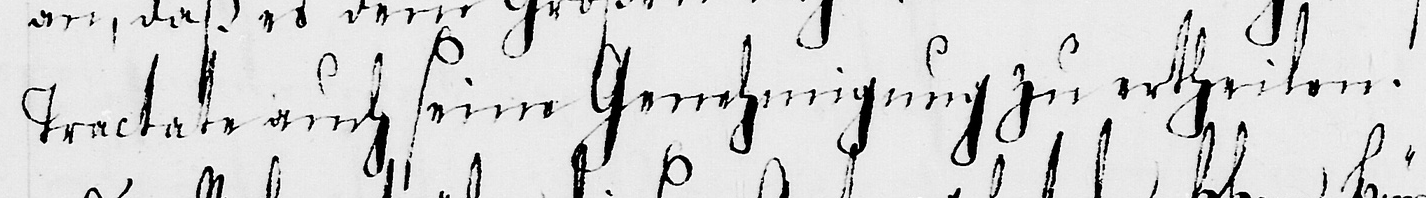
Tractate auch seine Genehmigung zu ertheilen.
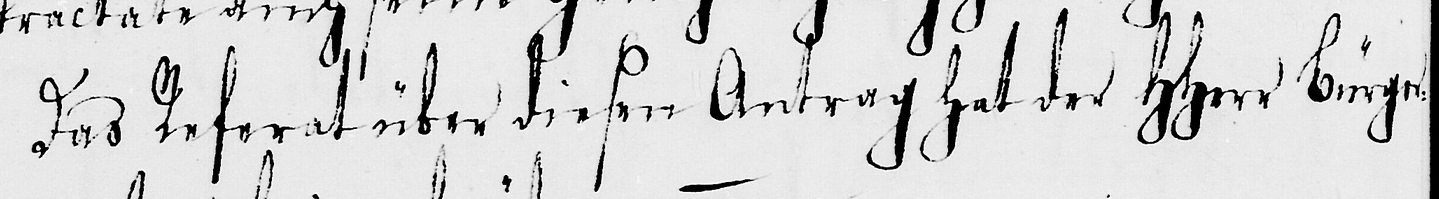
Das Referat über diesen Antrag hat der HHerr Bürge¬
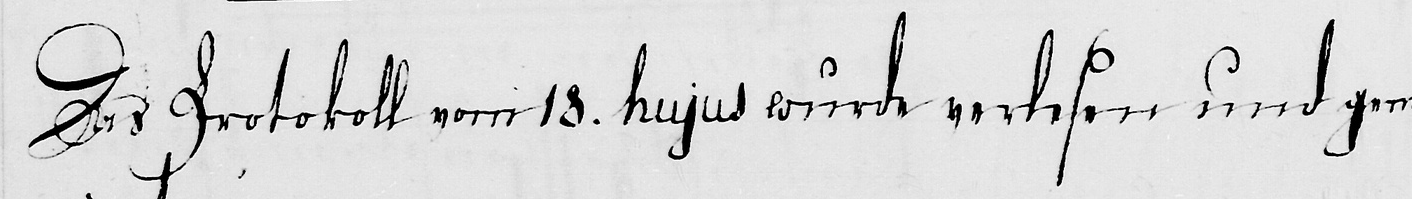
Das Protokoll vom 18. hujus wurde verlesen und ge¬
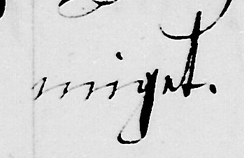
miget.
